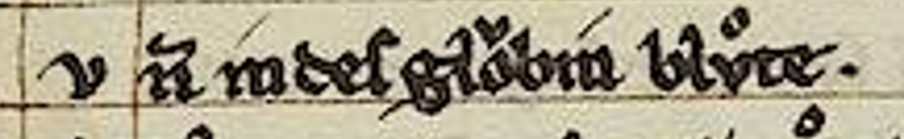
Vn(d) in deſ glo°vbin blv°ote.
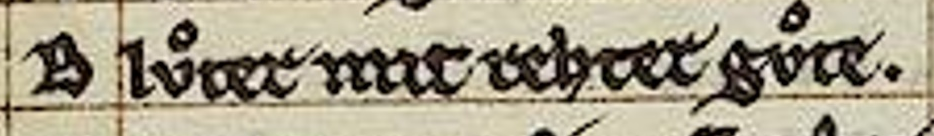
Blv°oter mit rehter gv°ote.
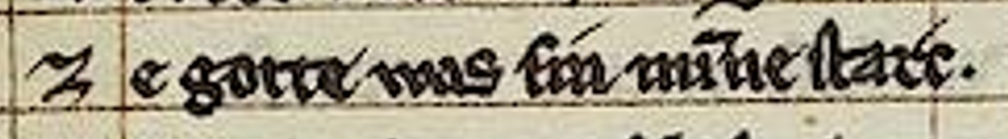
Ze gotte was ſin mi(n)ne ſtarc.
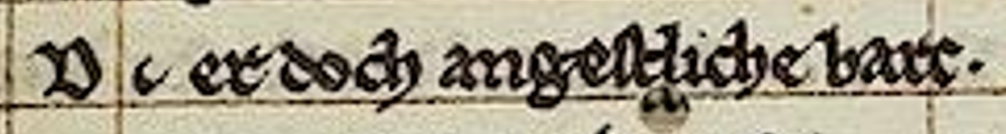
D(az) er doch angeſtliche barc.
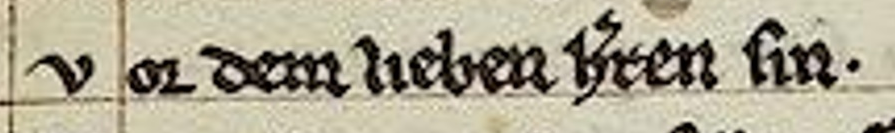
Vor dem lieben h(er)en ſin.
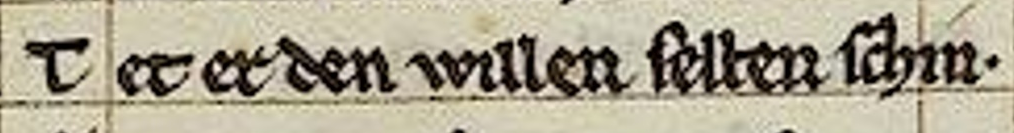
Tet er den willen ſelten ſchin.
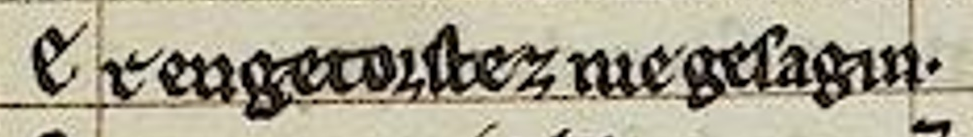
Er engetorſtez nie geſagin.
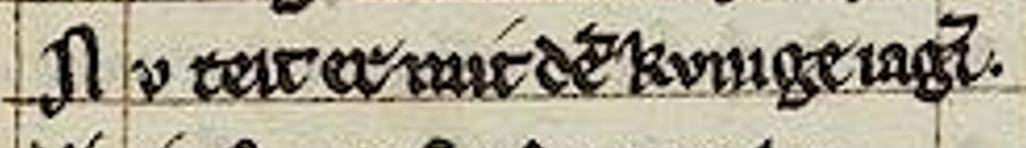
Nv reit er mit de(m) kvnige iagi(n)
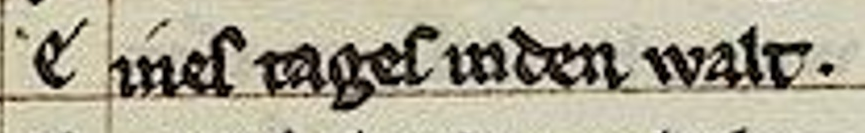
Eineſ tageſ in den walt.
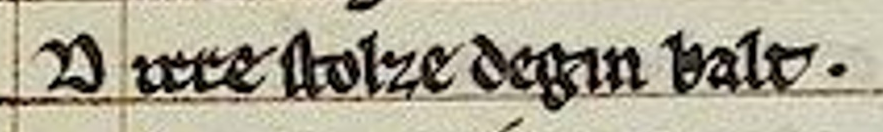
Dirre ſtolze degin balt.
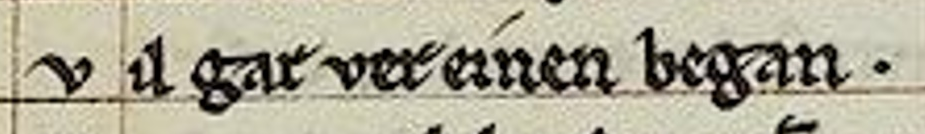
Vil gar vereinen began.
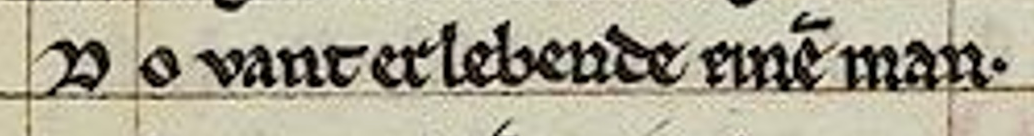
Do vant er lebende eine(n) man.
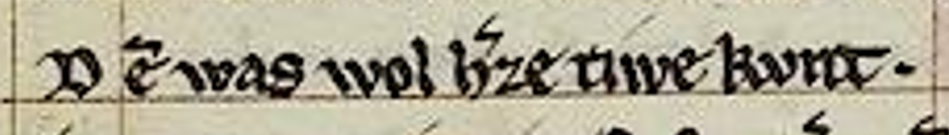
De(m) was wol h(er)ze riwe kvnt.
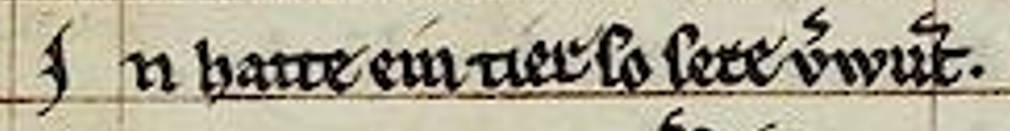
In hatte ein tier ſo ſere v(er)wu(n)t.
